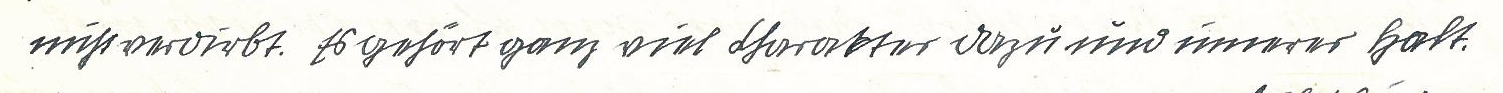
nicht verdirbt. Es gehört ganz viel Charakter dazu und innerer Halt.
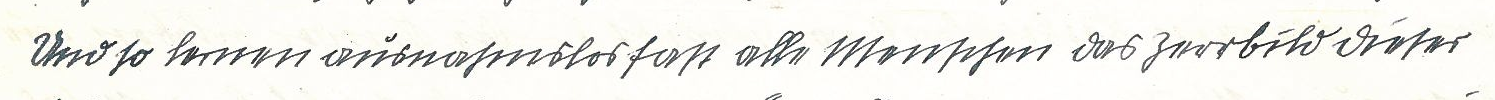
Und so lernen ausnahmslos fast alle Menschen das Zerrbild dieser
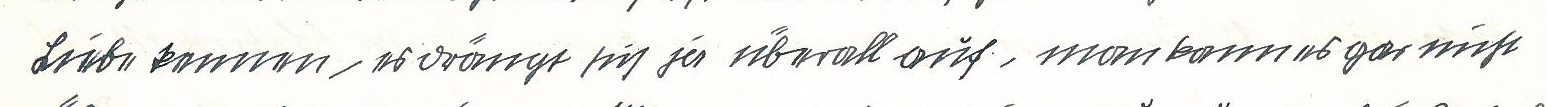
Liebe kennen, es drängt sich ja überall auf, man kann es gar nicht
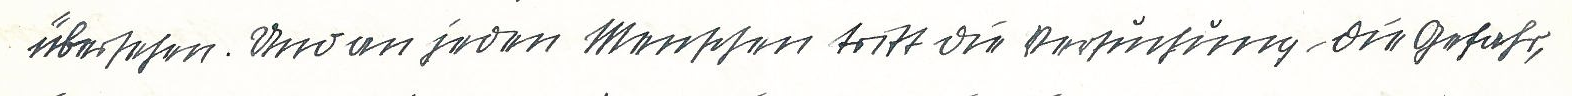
übersehen. Und an jeden Menschen tritt die Versuchung, die Gefahr,
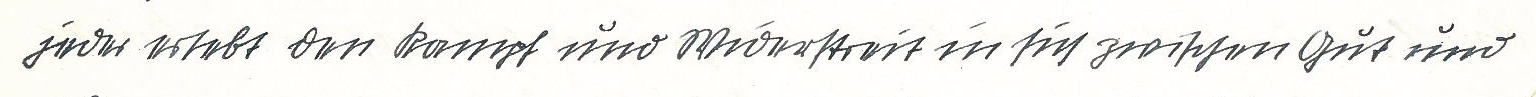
jeder erlebt den Kampf und Widerstreit in sich zwischen Gut und
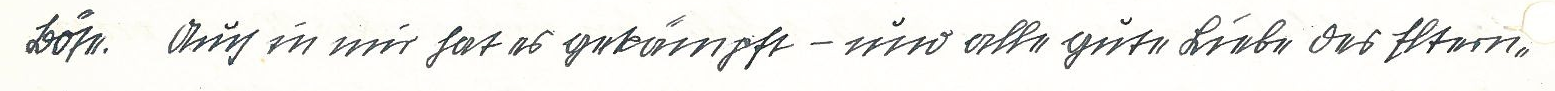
Böse. Auch in mir hat es gekämpft – und alle gute Liebe des Eltern¬
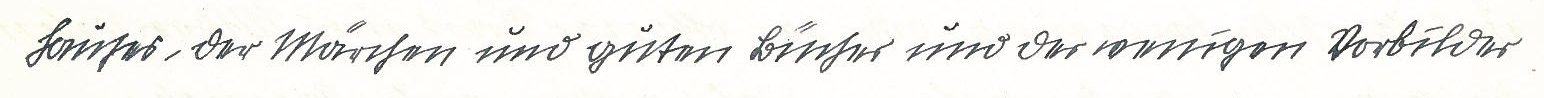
hauses, der Märchen und guten Bücher und der wenigen Vorbilder
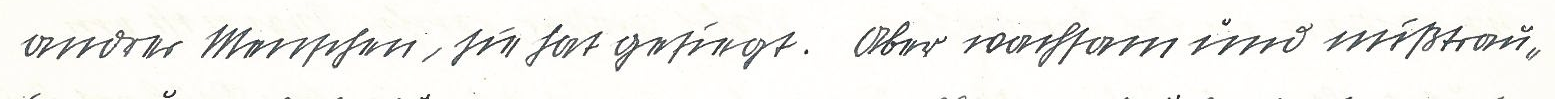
andrer Menschen, sie hat gesiegt. Aber wachsam und mißtrau¬
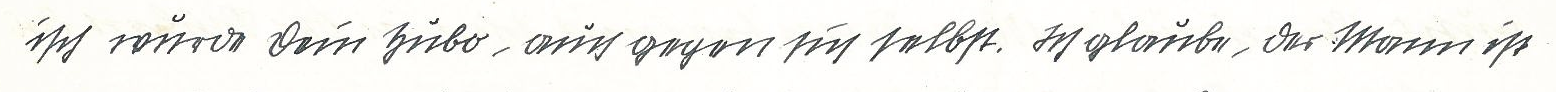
isch wurde Dein Hubo, auch gegen sich selbst. Ich glaube, der Mann ist
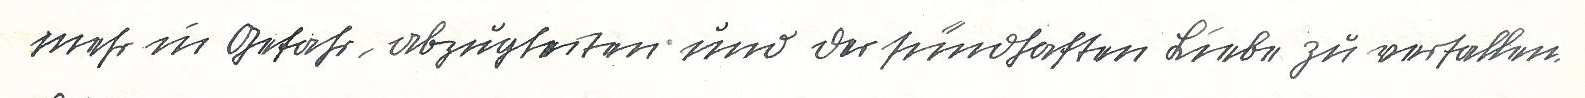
mehr in Gefahr, abzugleiten und der sündhaften Liebe zu verfallen.
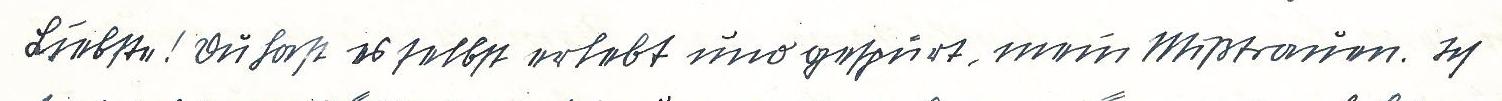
Liebste! Du hast es selbst erlebt und gespürt, mein Mißtrauen. Ich
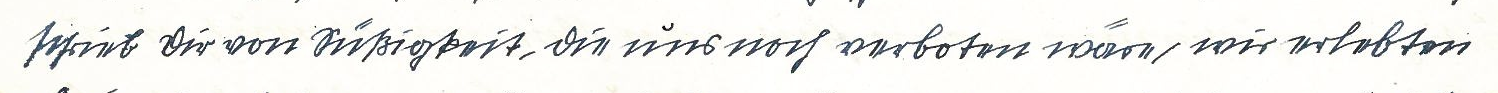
schrieb Dir von Süßigkeit, die uns noch verboten wäre, wir erlebten
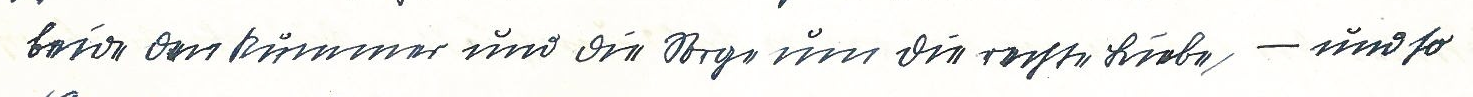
beide den Kummer und die Sorge um die rechte Liebe, – und so
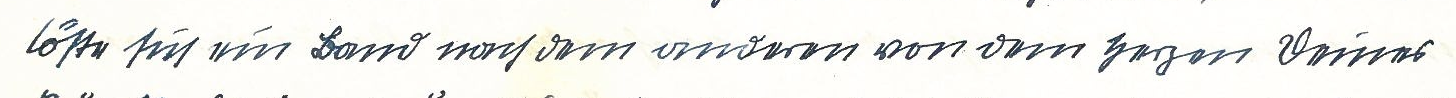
löste sich ein Band nach dem anderen von dem Herzen Deines
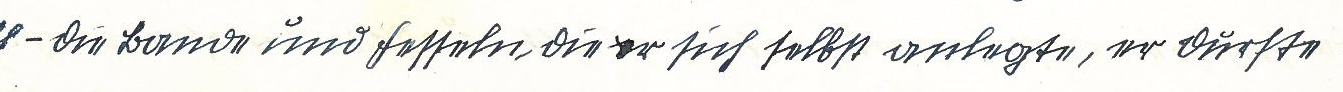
– die Bande und Fesseln, die er sich selbst anlegte, er durfte
